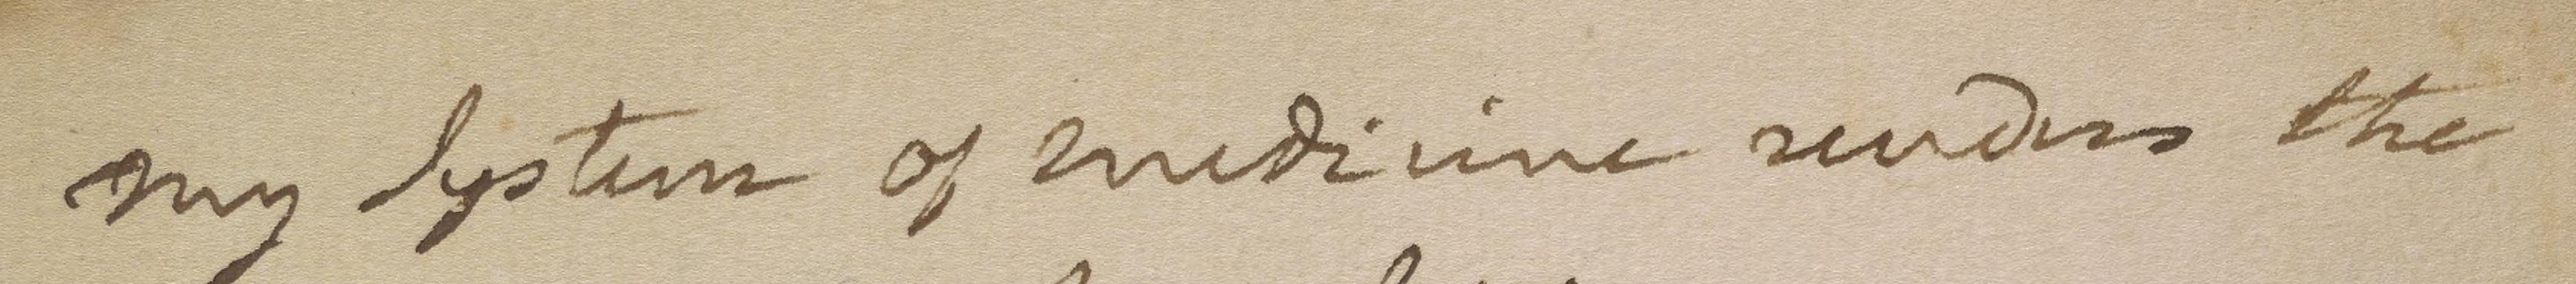any system of medicine under the
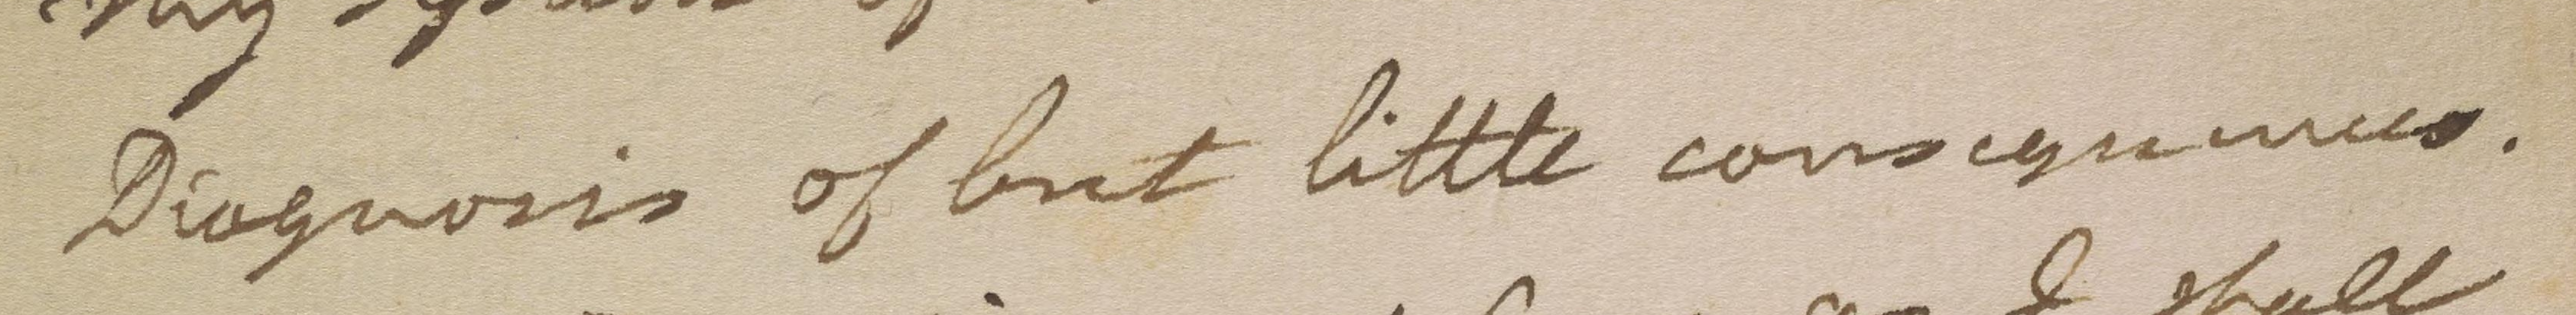Diagnosis of but little consequences.
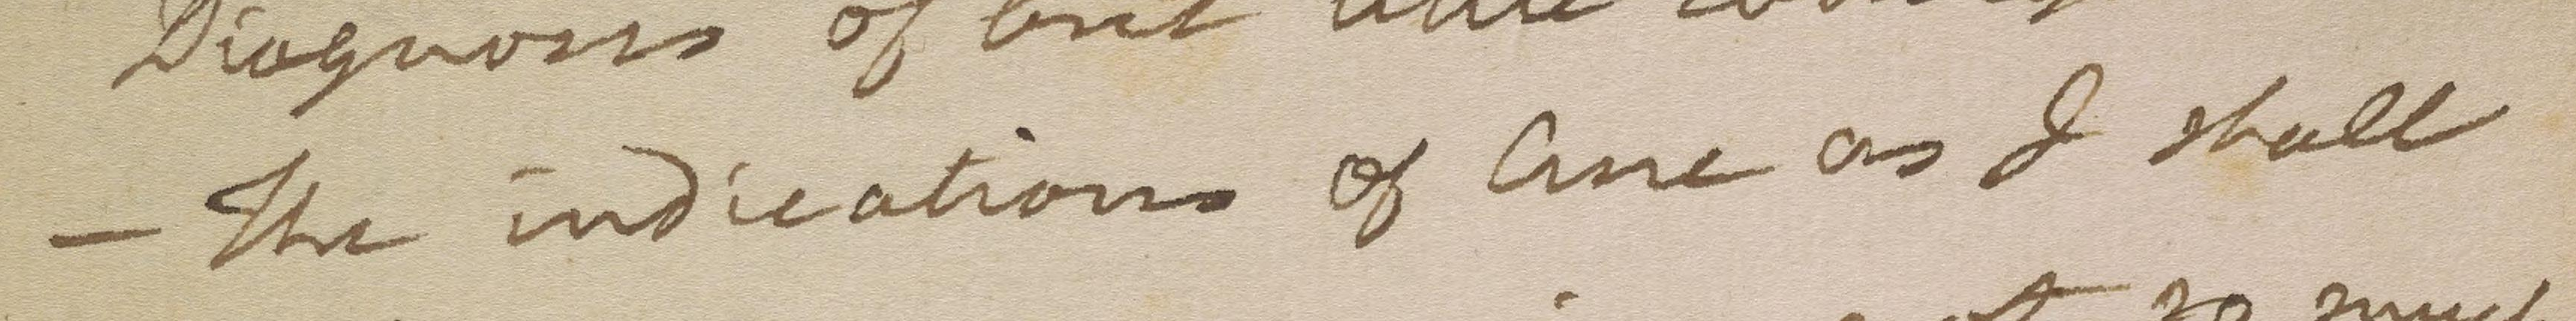- The indications of are as I shall
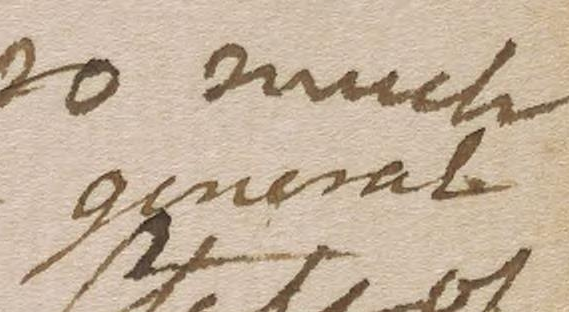general
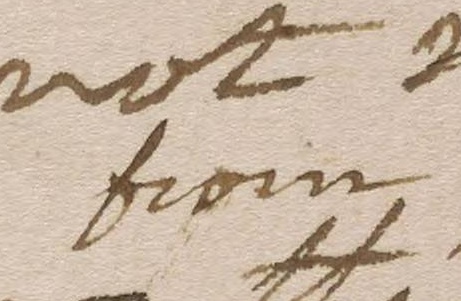from
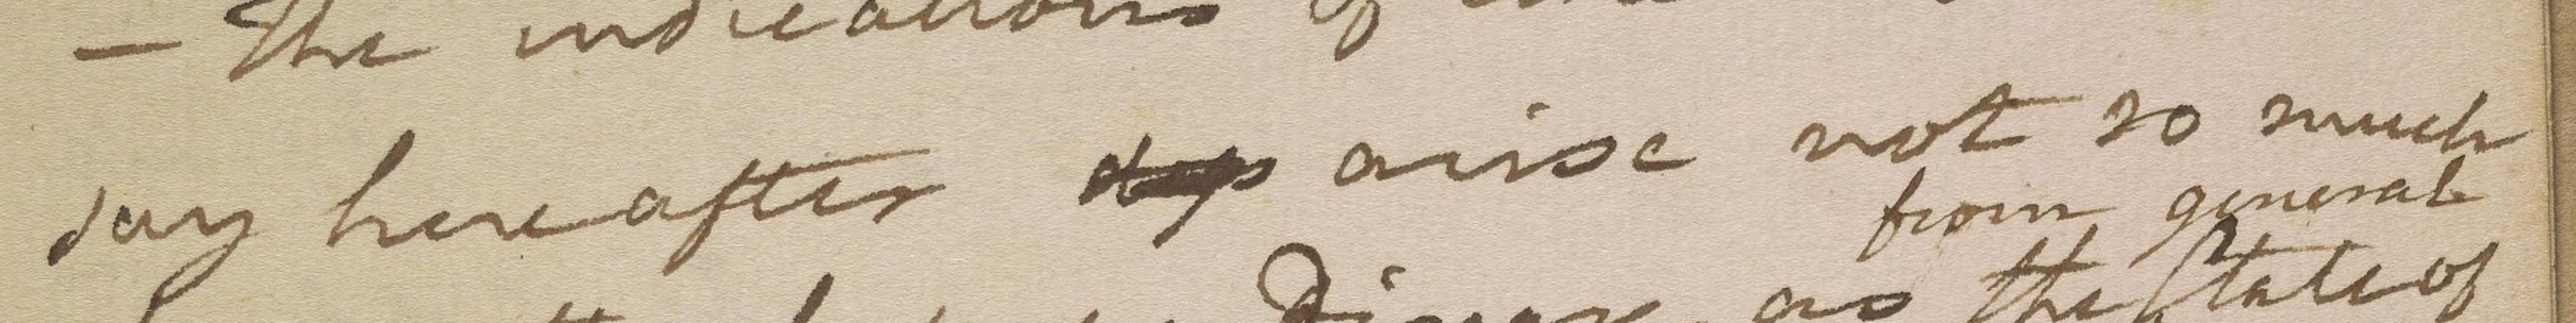say hereafter [___] arise not so much
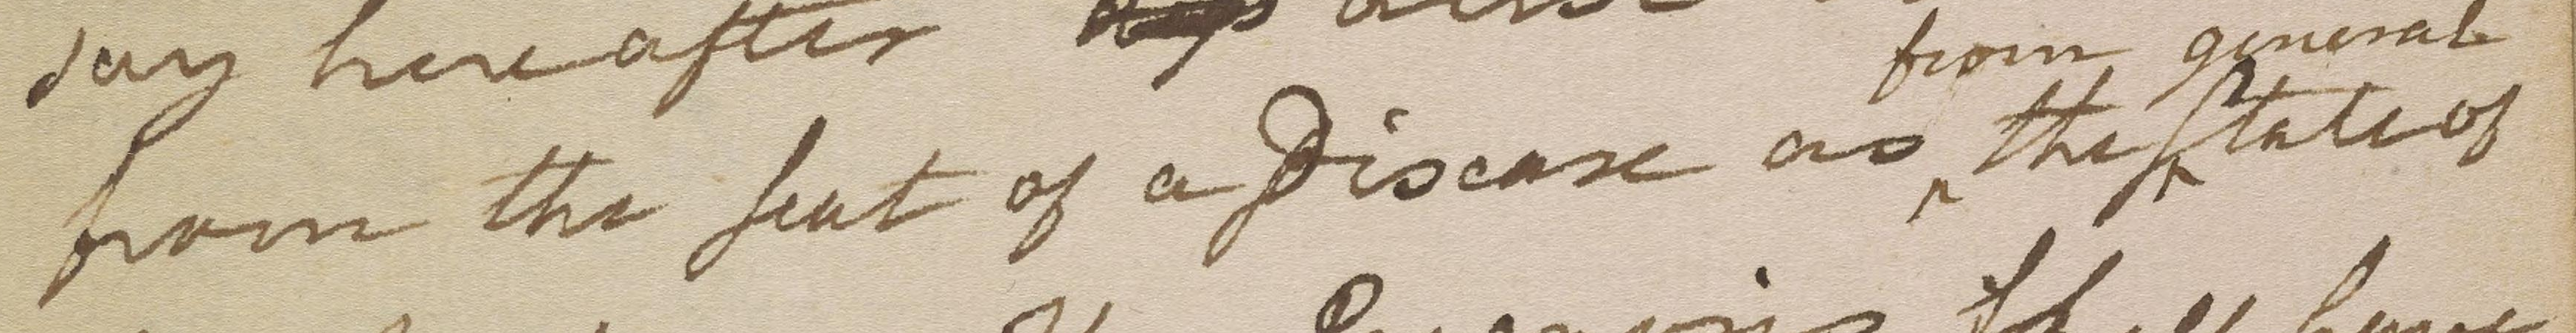from the seat of a Disease as ^ the ^ state of
